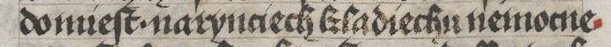do mieſt.naryncíech kladíechu nemocne.
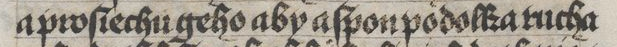a proſiechu geho aby aſpon podalka rucha
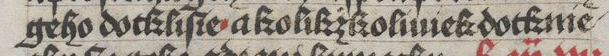geho dotkli ſie.a kolikžizoliuek dotknie¬
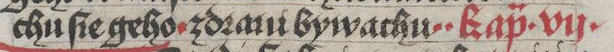chu ſie geho.zdraui bywachu. kap̄. vij.
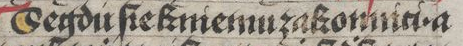Segdu ſie k niemu zakonnici.a
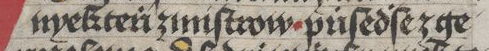nyekteṙi zmiſtrow.pṙiſeḋẛe z ge¬
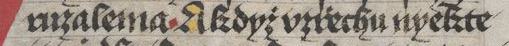ruzalema.A kdyż vzṙechu nyekte¬
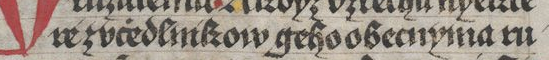ré z vċedlníkow geho obecnyma ru¬
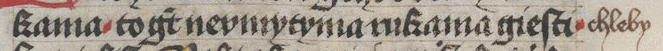kama.to ḡt nevmytyma rukama gíeſti. chleby
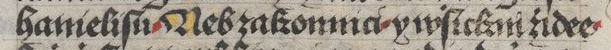hanieli ſu.Neb zakonnici y wẛickni żidee.
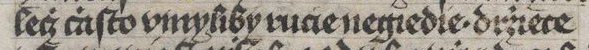lecż čaſto vmyliby rucie negíedie držiece
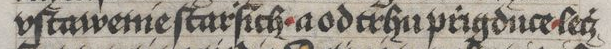vſtraweníe ſtarẛích.a odtrhu pṙigduce.lecż
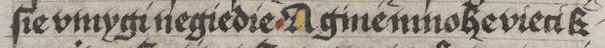ſie vmygí negíedíe. A gíné mnohe vieci k¬
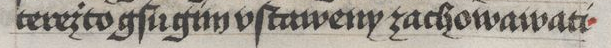tereżto gſu gim vſtaweny zachowawati.
